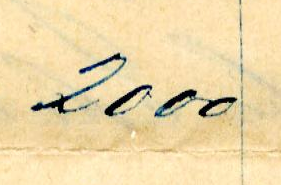2000
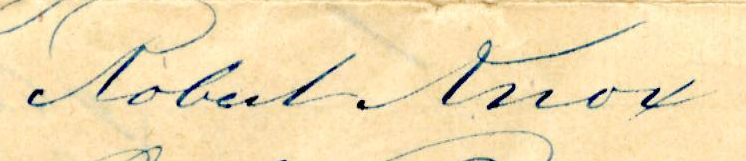Robert Knox
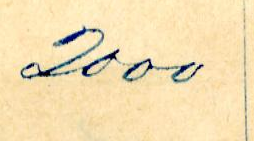2000
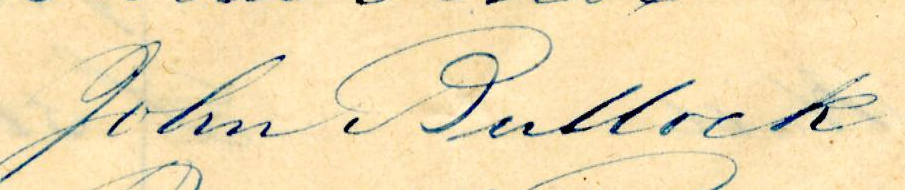John Bullock
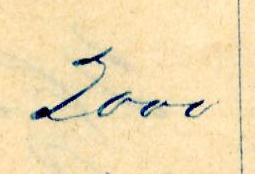2000
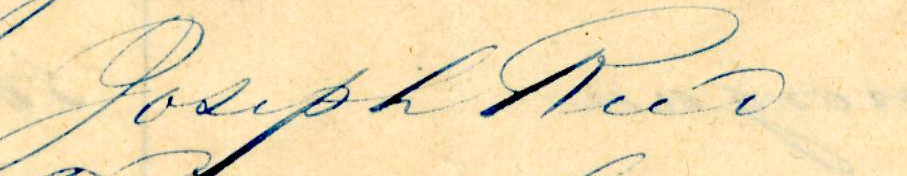Joseph Reed
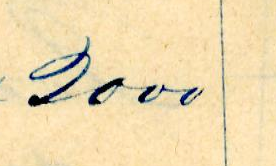2000
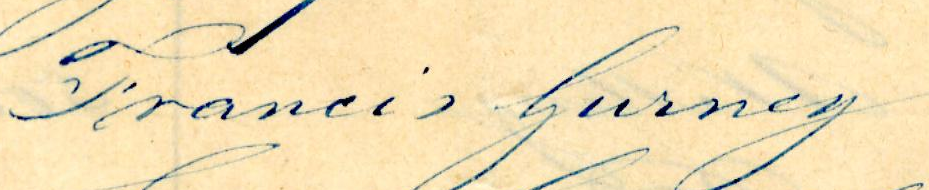Francis Gurney
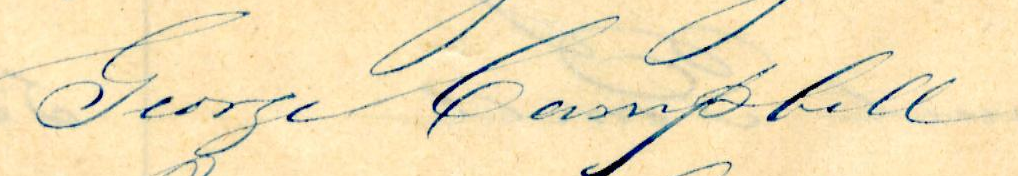George Campbell
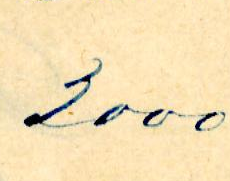2000
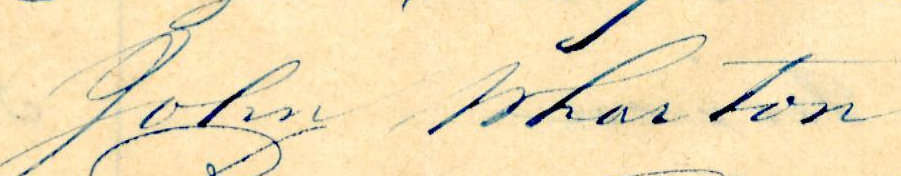John Wharton
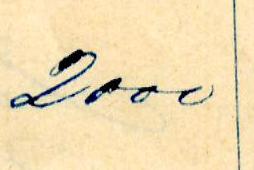2000
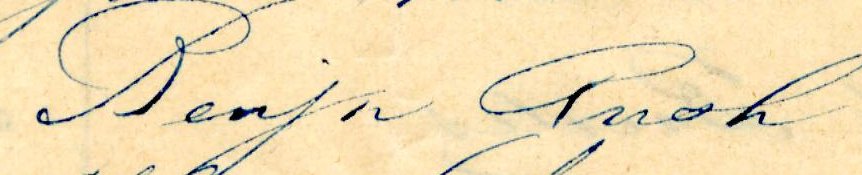Benjn Rush
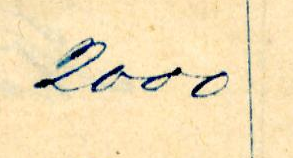2000
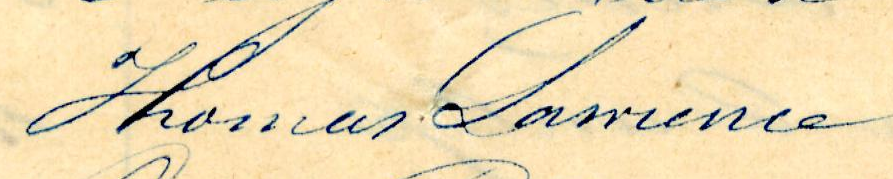Thomas Lawrence
